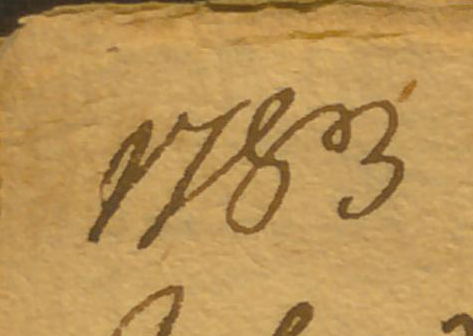1783
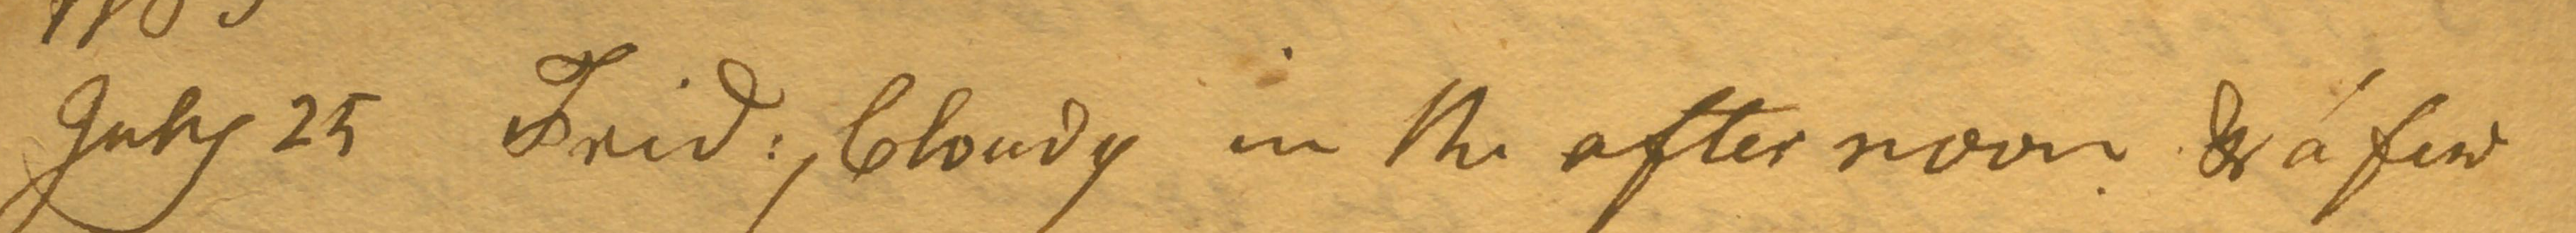July 25 Frid:, Cloudy in the afternoon & a few
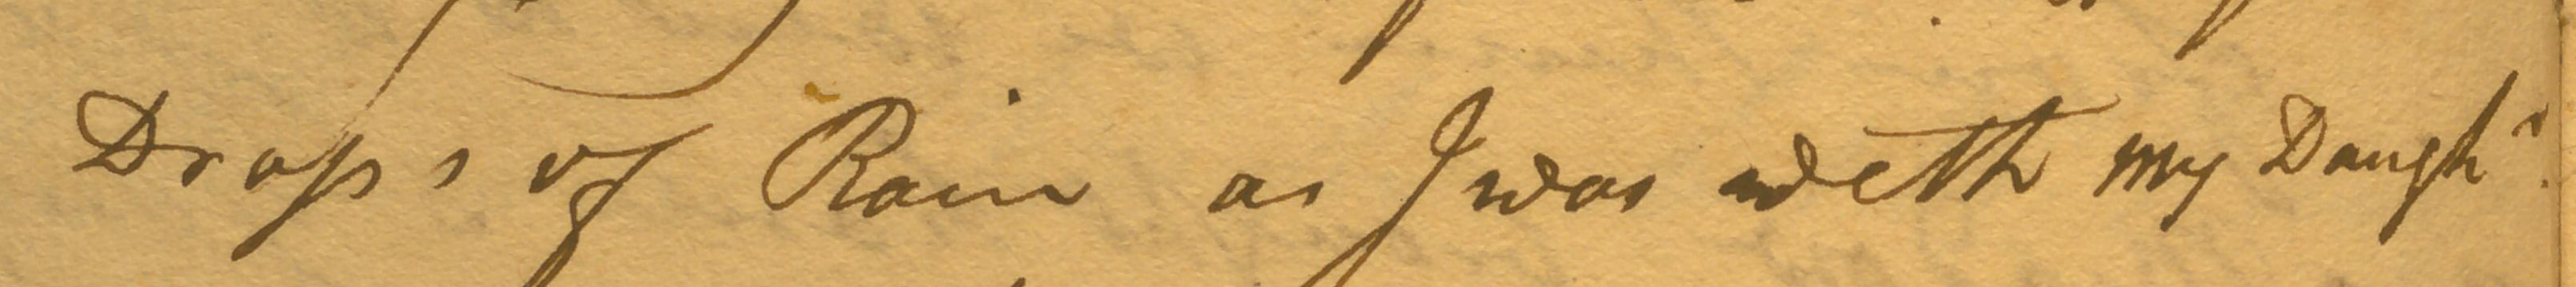Drops of Rain as I was with my Daugh^r.
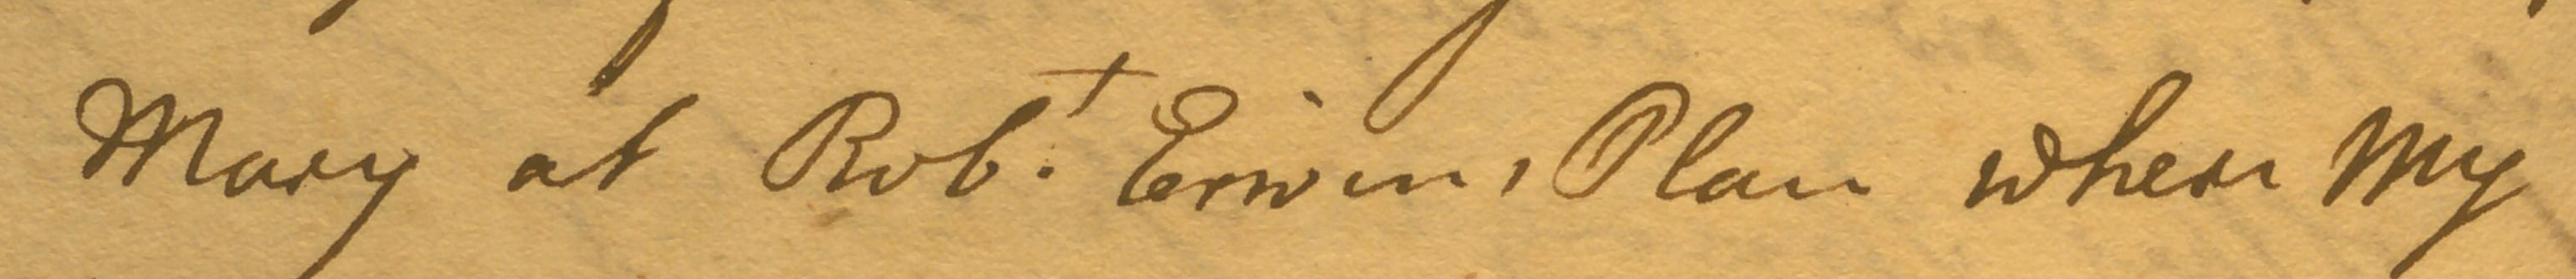Mary at Rob^t. Erwins Plan where My
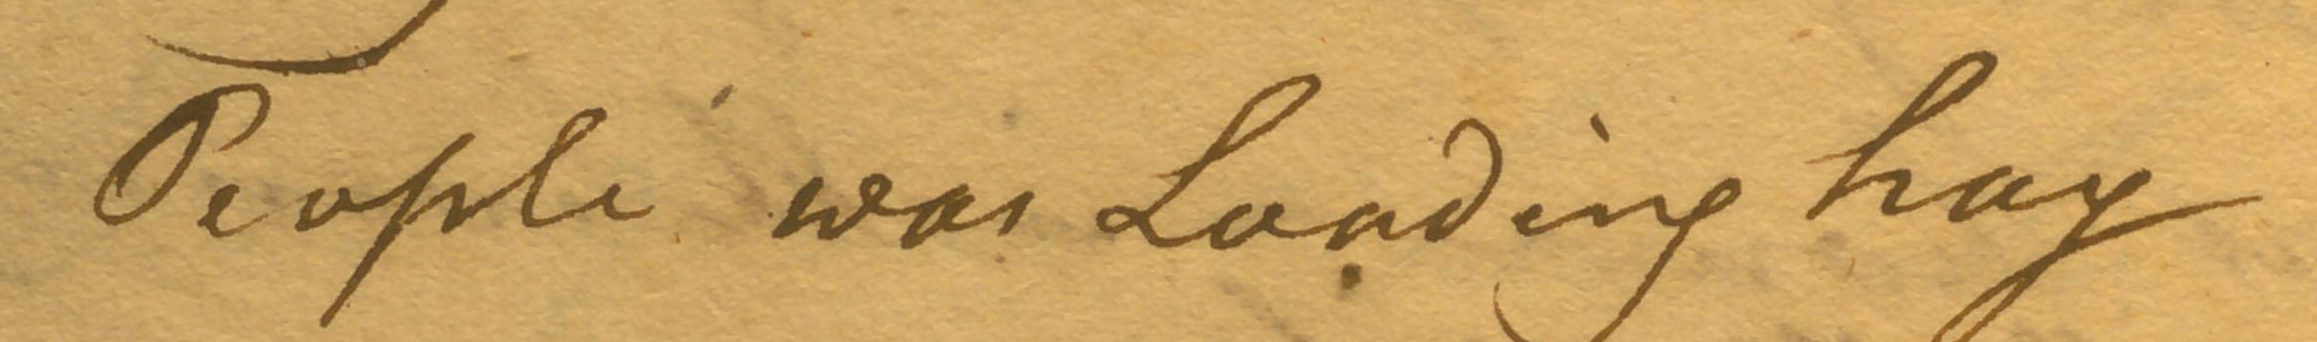People was Loading hay
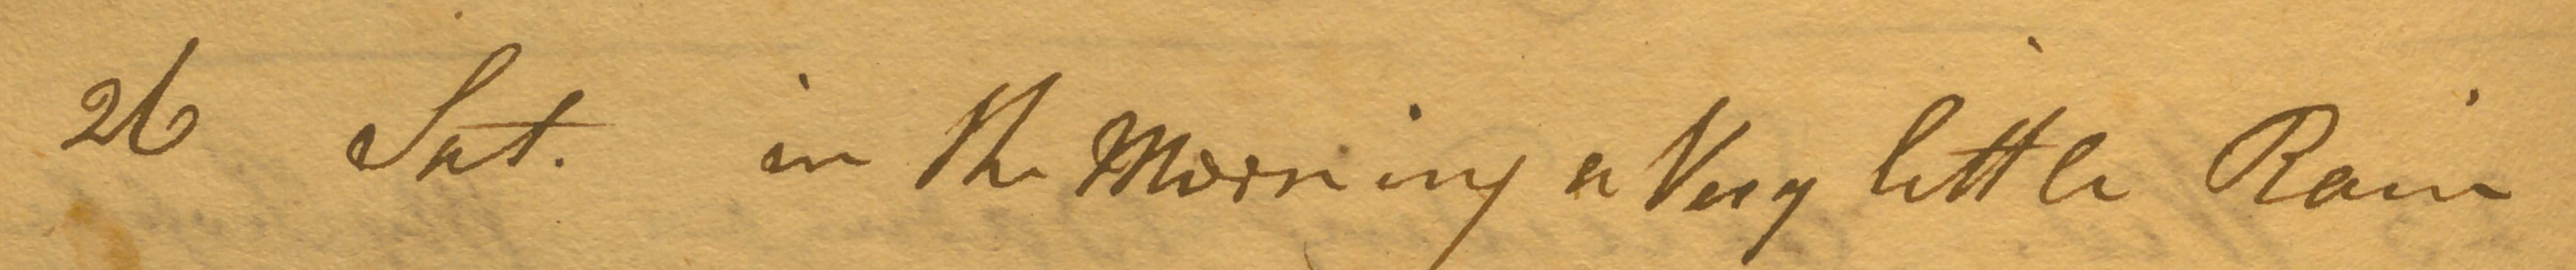26 Sat. in the Morning a Very little Rain
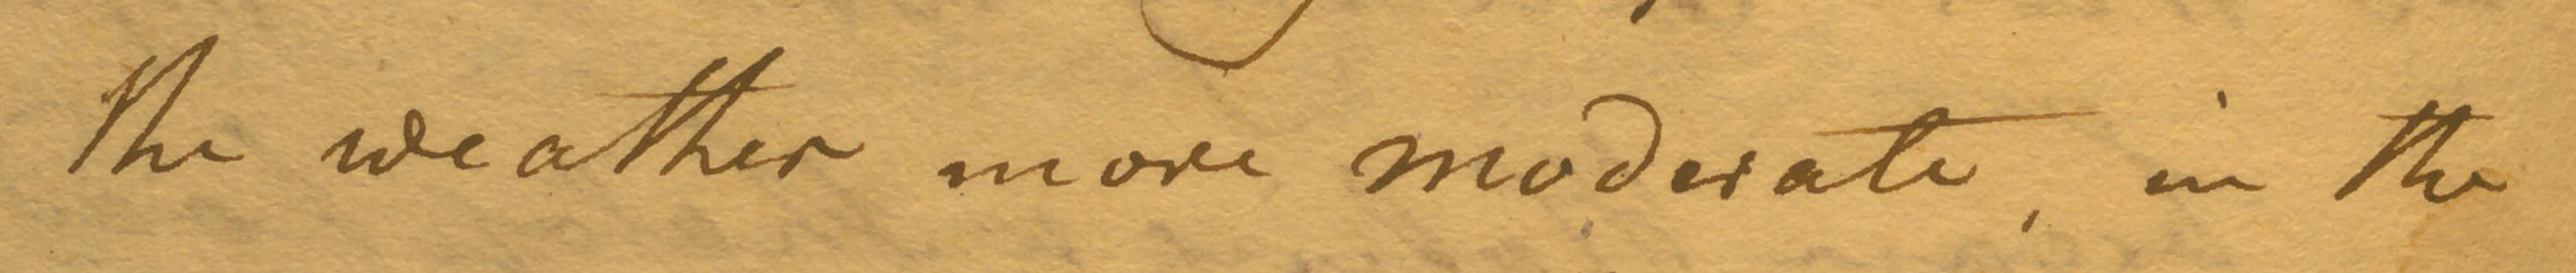the weather more moderate in the
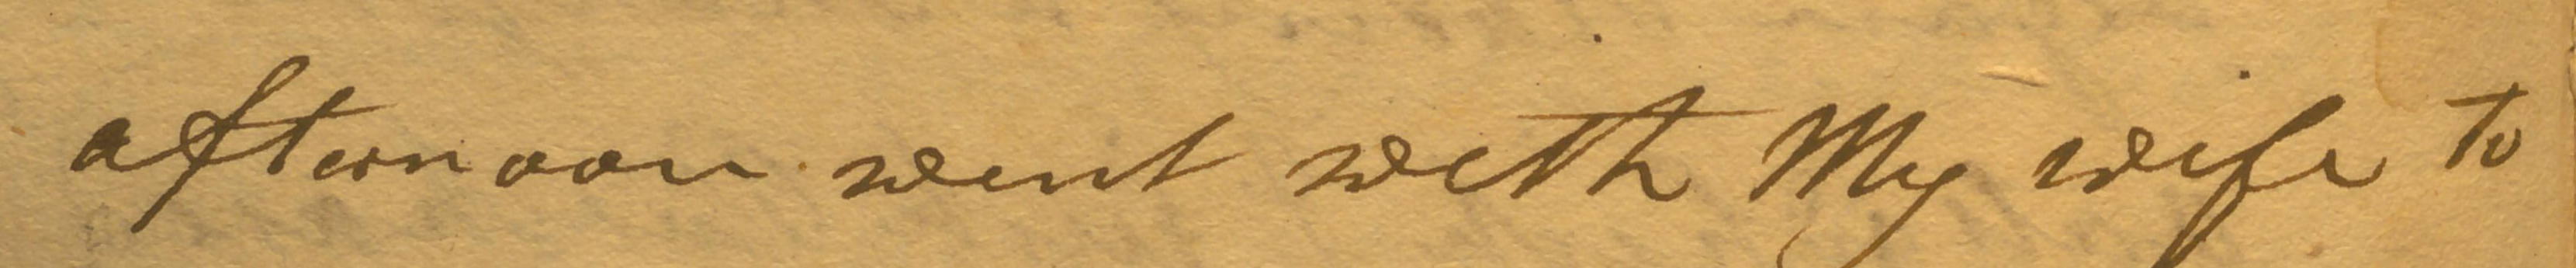afternoon went with My wife to
